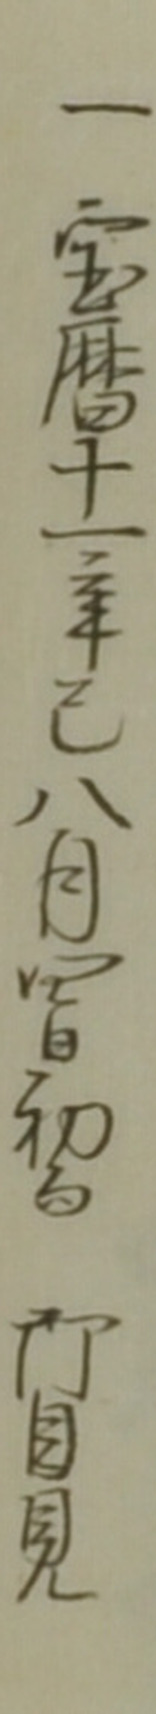一宝暦十一辛巳八月四日初而御目見
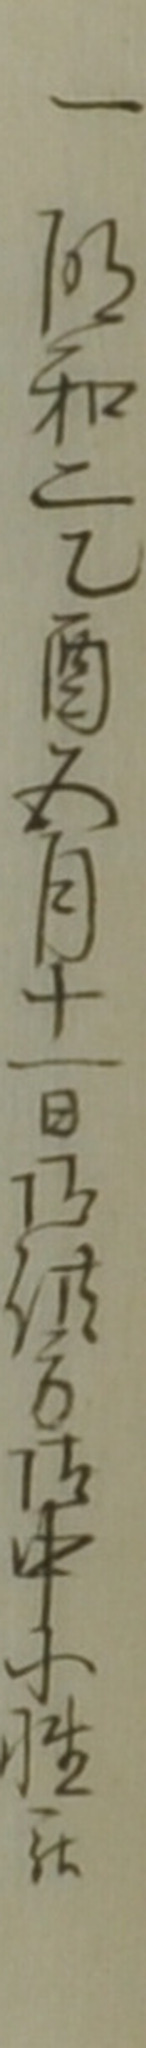一明和二乙酉五月十一日御供方御中小性被
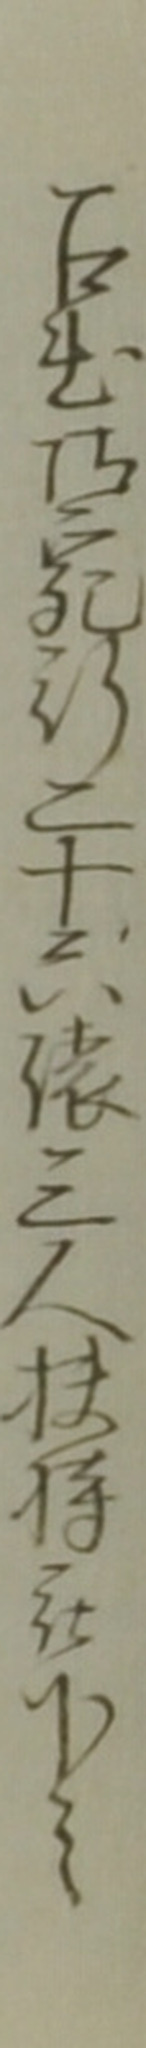召出御宛行二十六俵三人扶持被下之
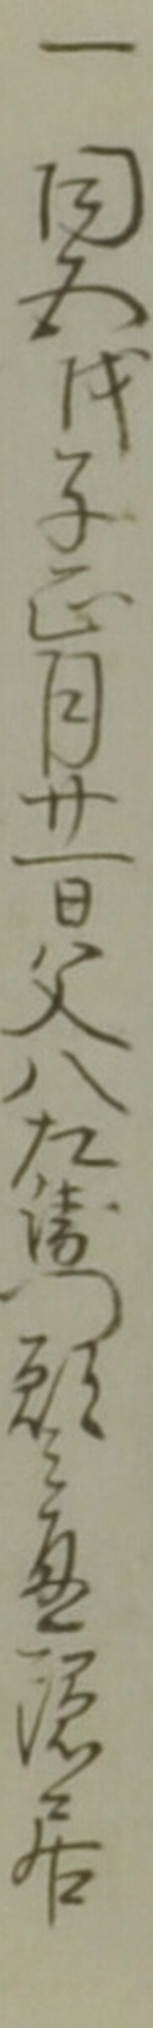一同五戊子正月廿一日父八左衛門願之通隠居
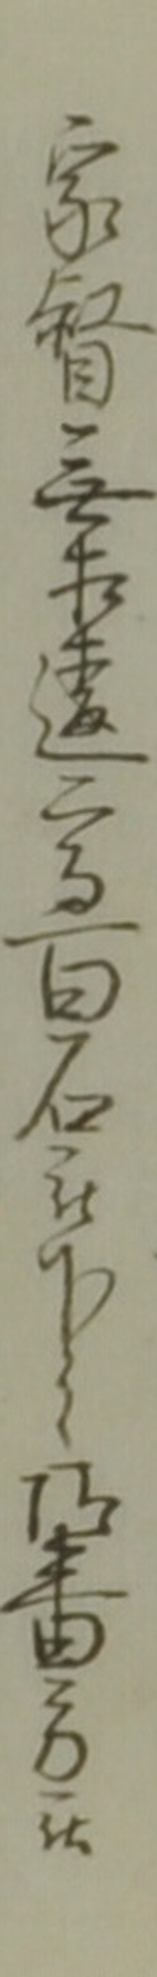家督無相違高百石被下之御番方被
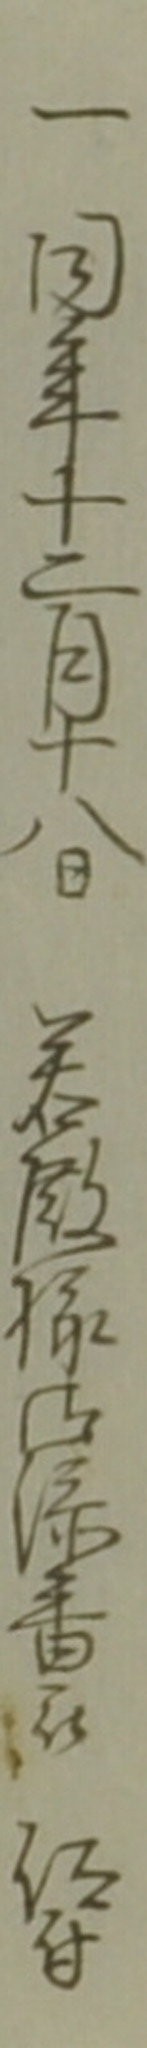一同年十二月十八日若殿様御添番被仰付
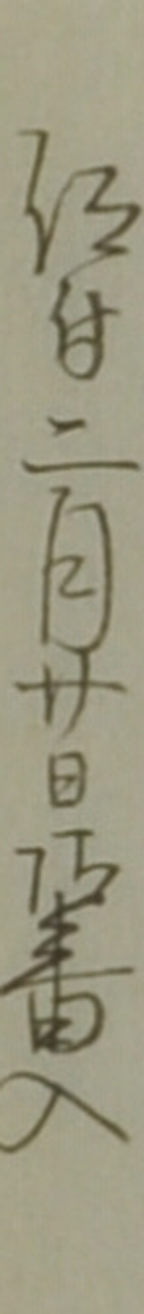仰付二月廿日御番入
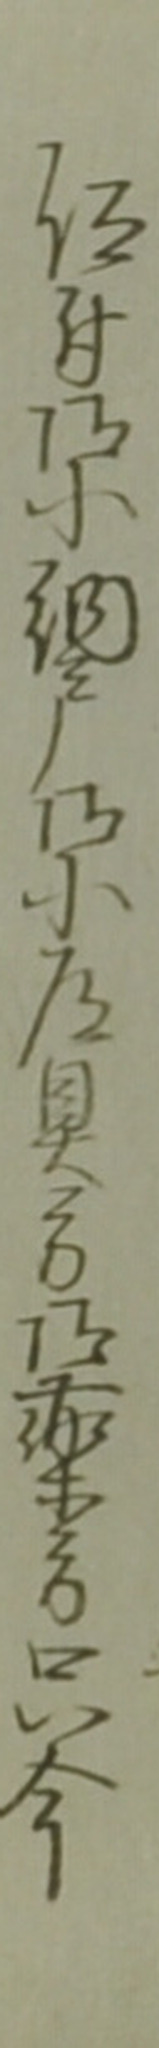仰付御小納戸御小道具方御薬方只今
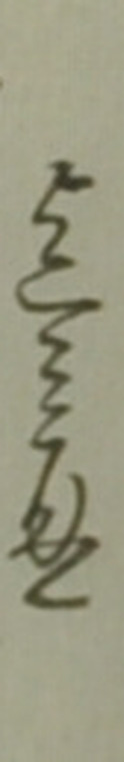迄之通
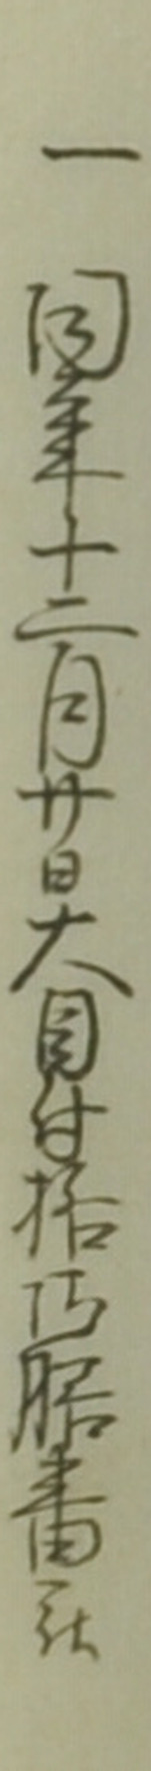一同年十二月廿日大目付格御膳番被

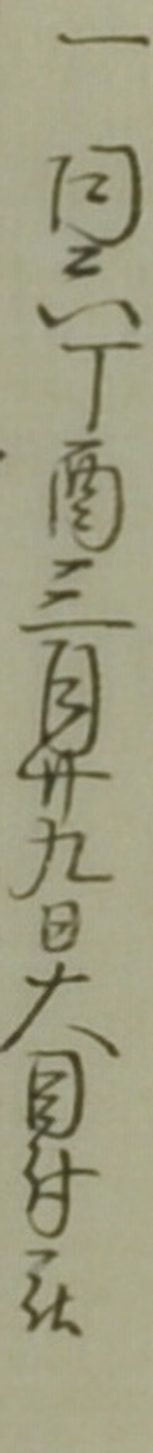一同六丁酉三月廿九日大目付被
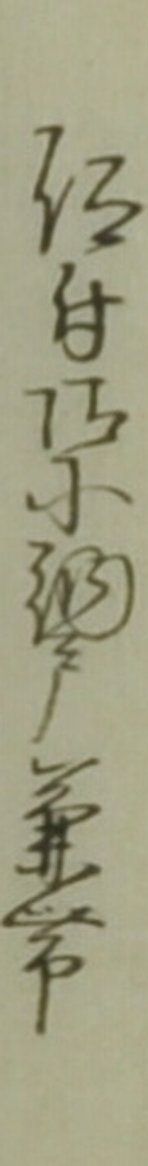仰付御小納戸兼帯
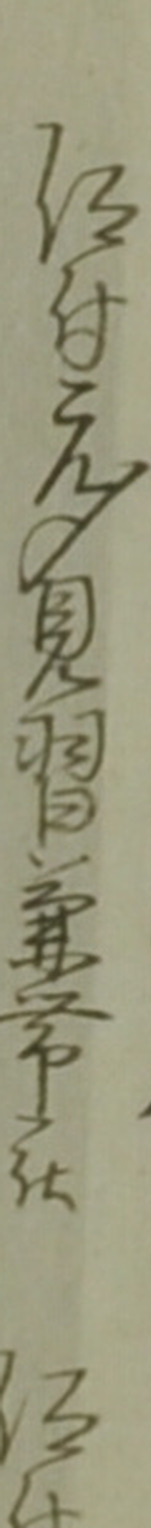仰付元〆見習兼帯被仰付
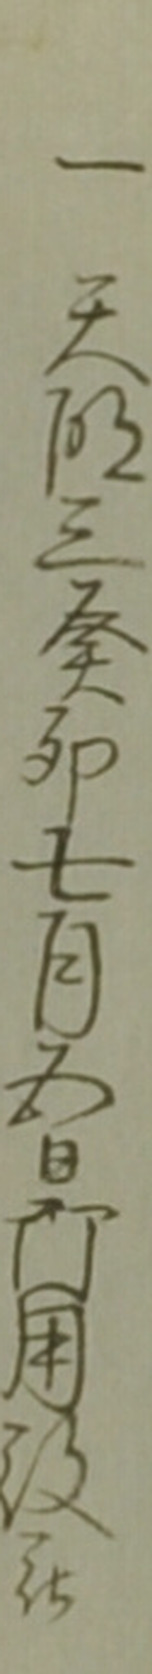一天明三癸卯七月五日御用役被
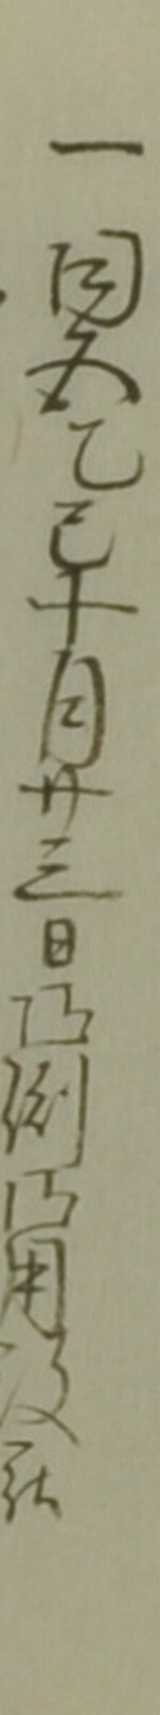一同五乙巳十月廿三日御側御用役被
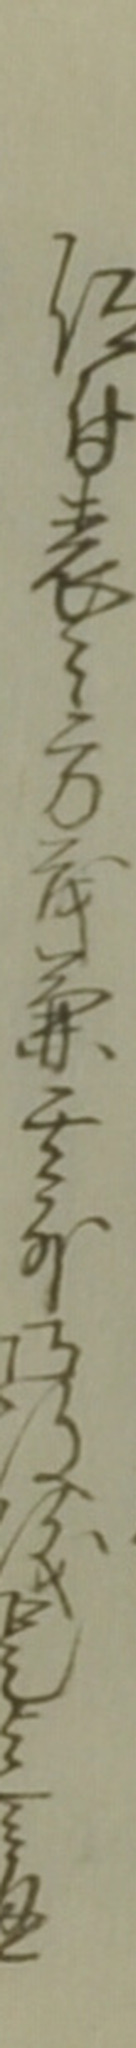仰付表之方茂兼其外御役儀是迄之通
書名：給人諸士勤仕録（三）
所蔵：伊那市立高遠町図書館・合同会社AMANE
